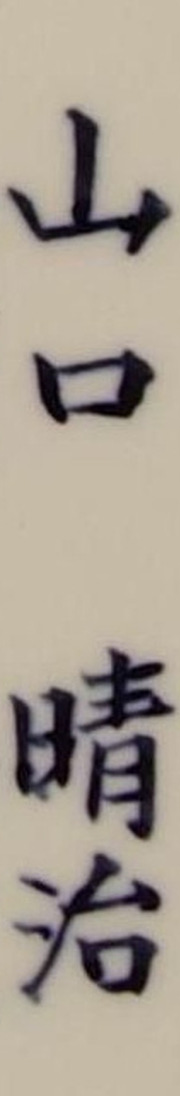山口晴治
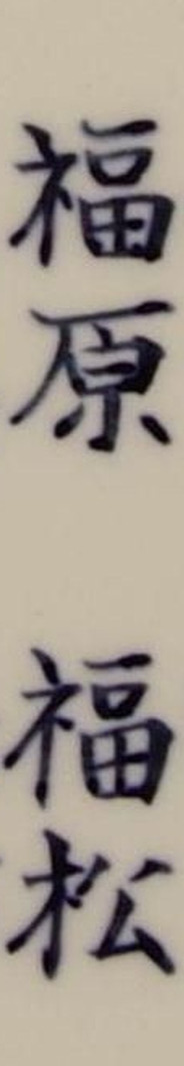福原福松
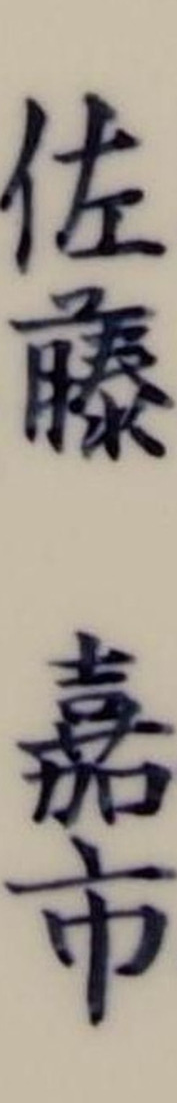佐藤嘉市
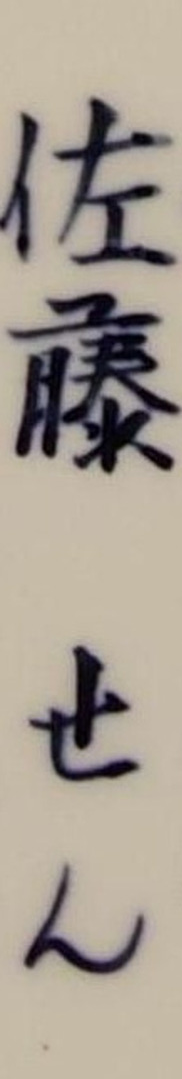佐藤せん
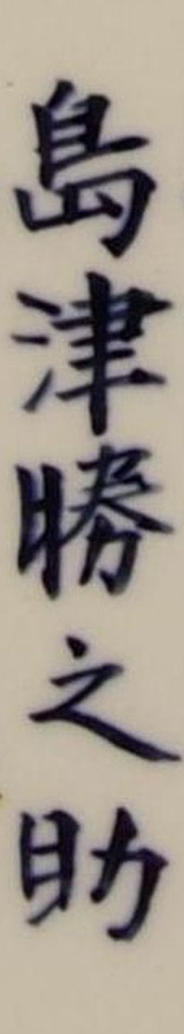島津勝之助
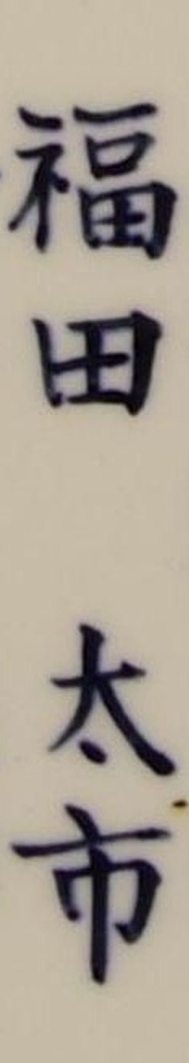福田太市
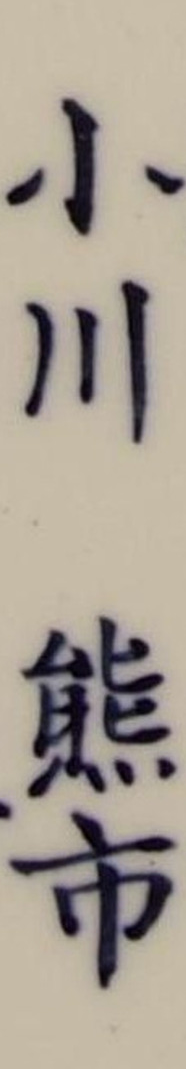小川熊市
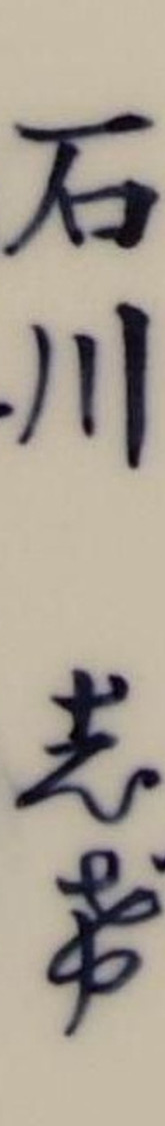石川しげ
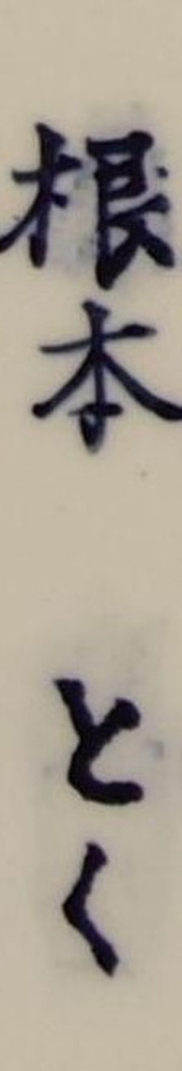根本とく
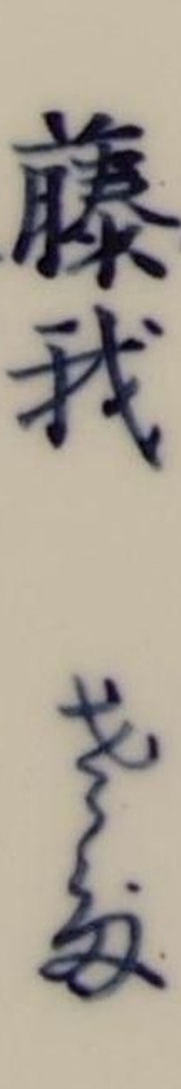藤我さた
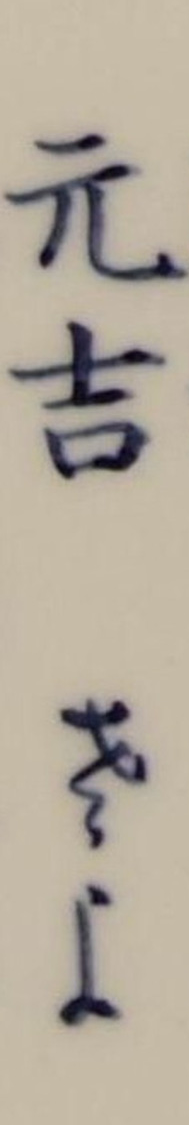元吉さよ
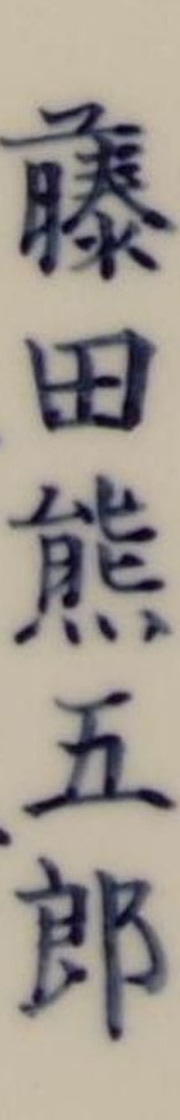藤田熊五郎
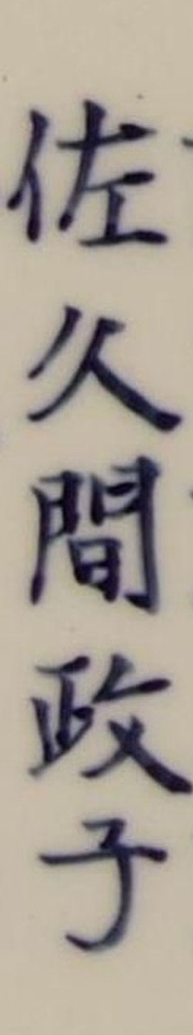佐久間政子
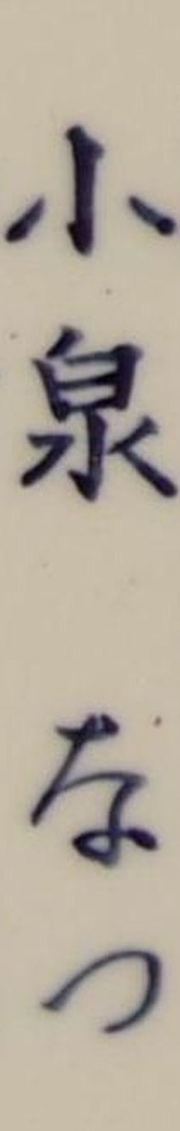小泉なつ
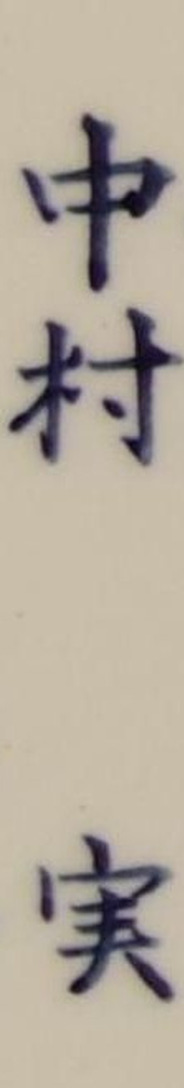中村実

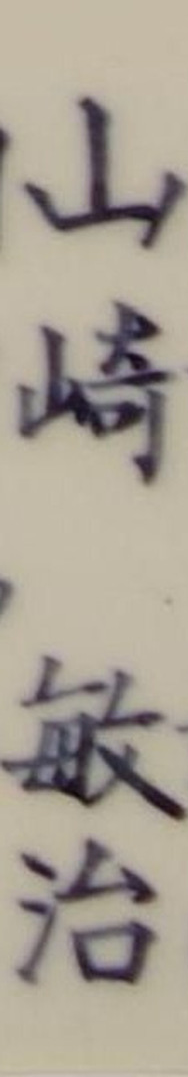山崎敏治
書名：E~L
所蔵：高野山金剛峯寺
